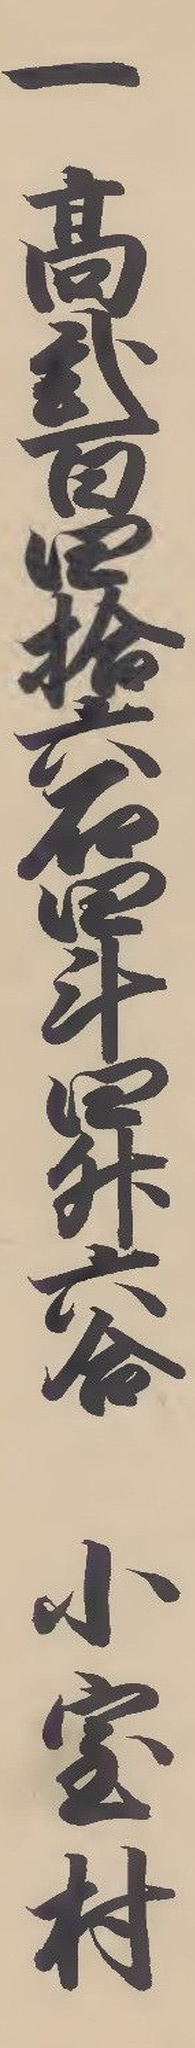一高弐百四拾六石四斗四升六合小室村

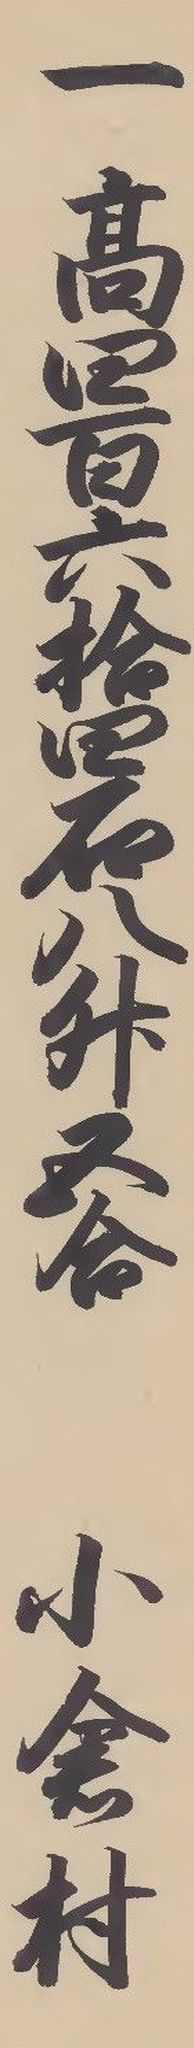一高四百六拾四石八升五合小倉村
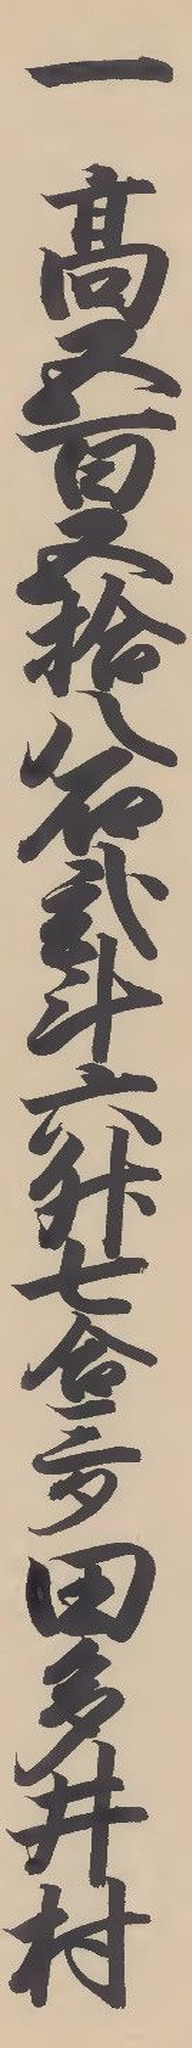一高五百五拾八石弐斗六升七合三勺田多井村
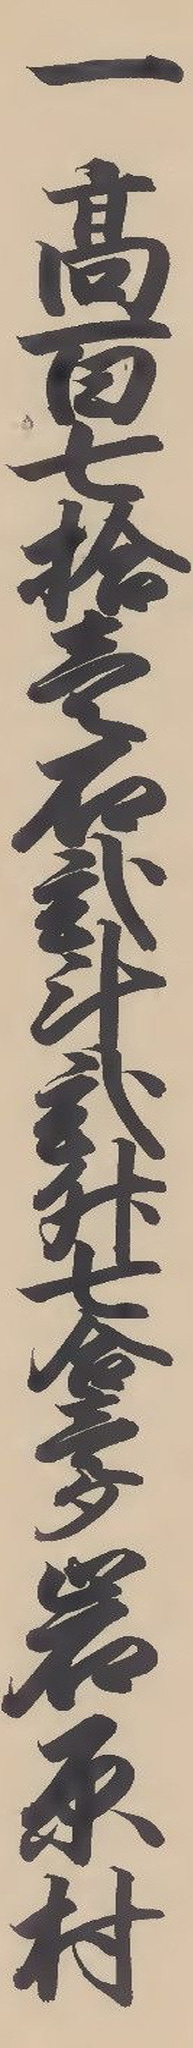一高百七拾壱石弐斗弐升七合壱勺岩原村
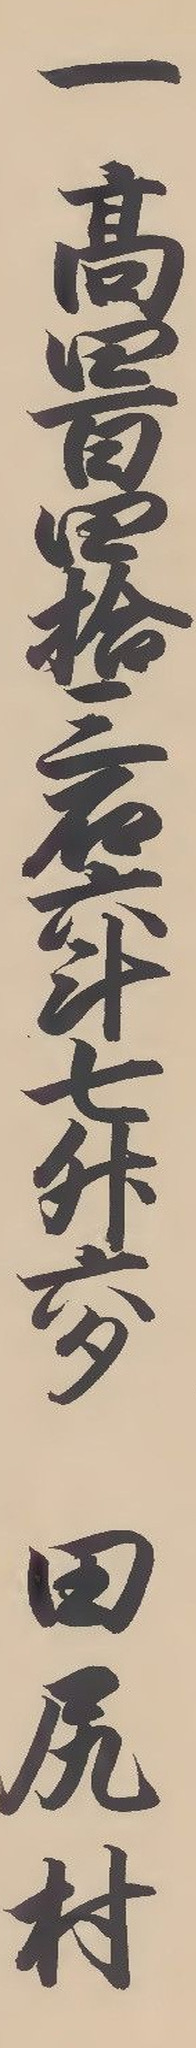一高四百四拾三石六斗七升六勺田尻村
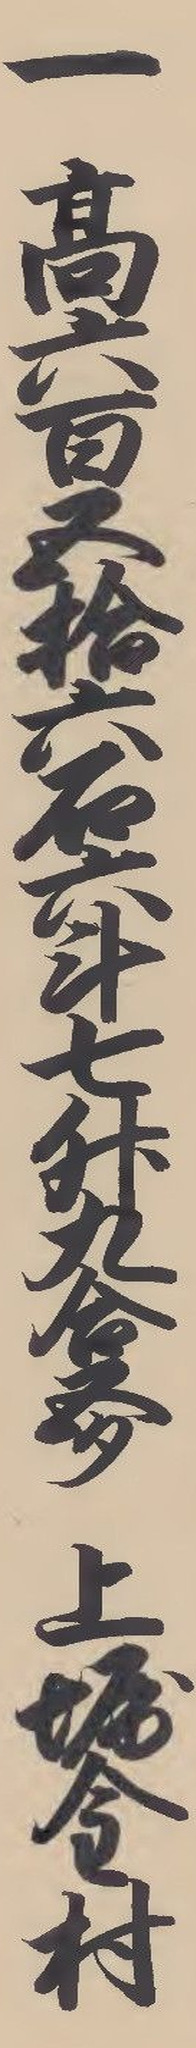一高六百五拾六石六斗七升九合五勺上堀金村
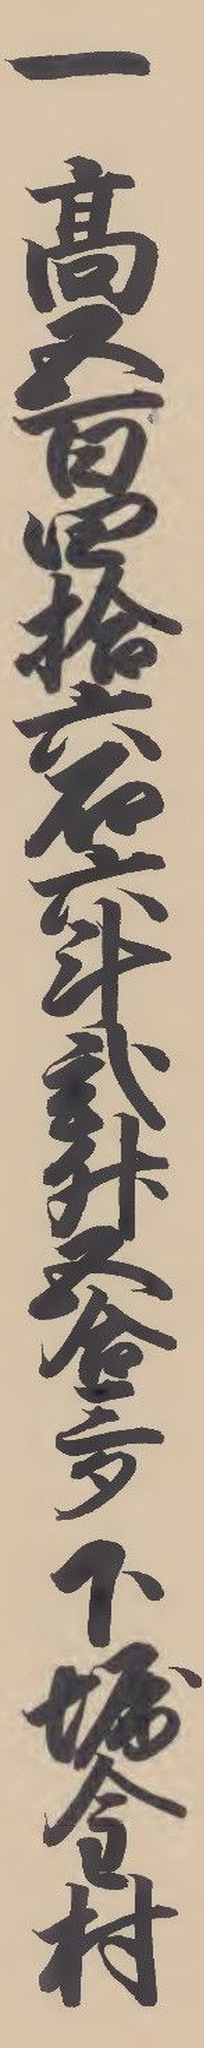一高五百四拾六石六斗弐升五合三勺下堀金村

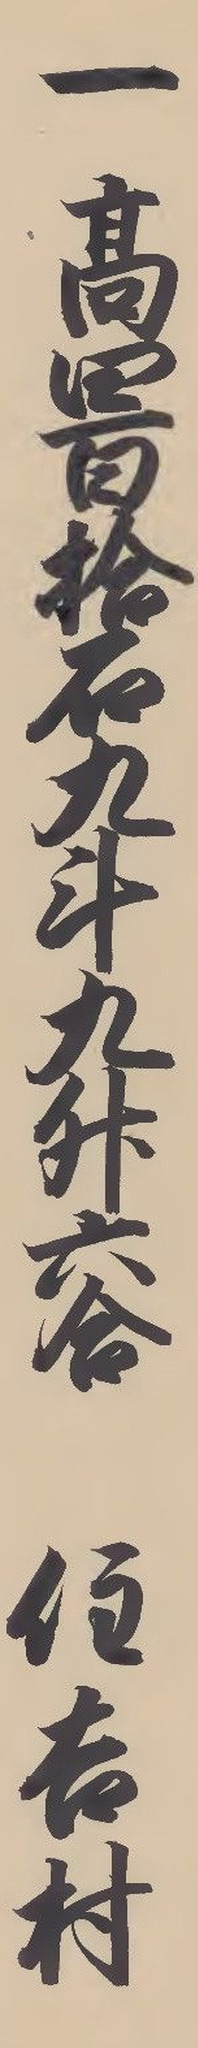一高四百拾石九斗九升六合住吉村
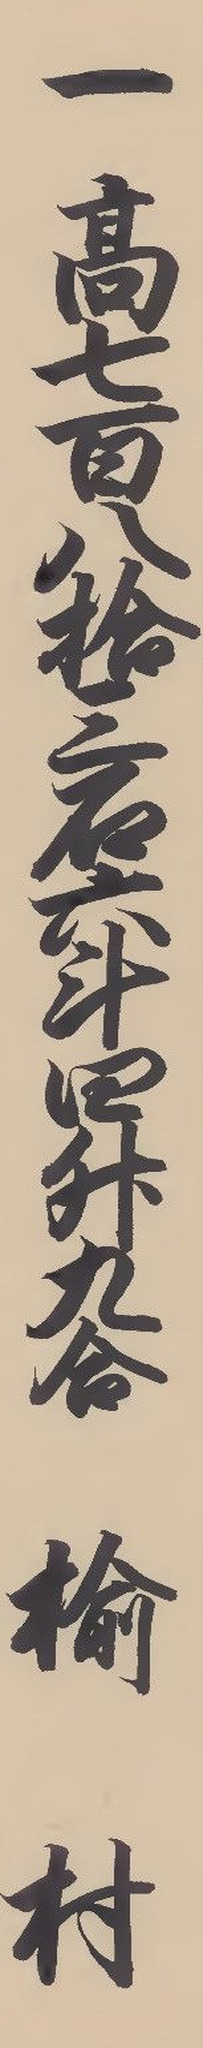一高七百八拾三石六斗四升九合楡村
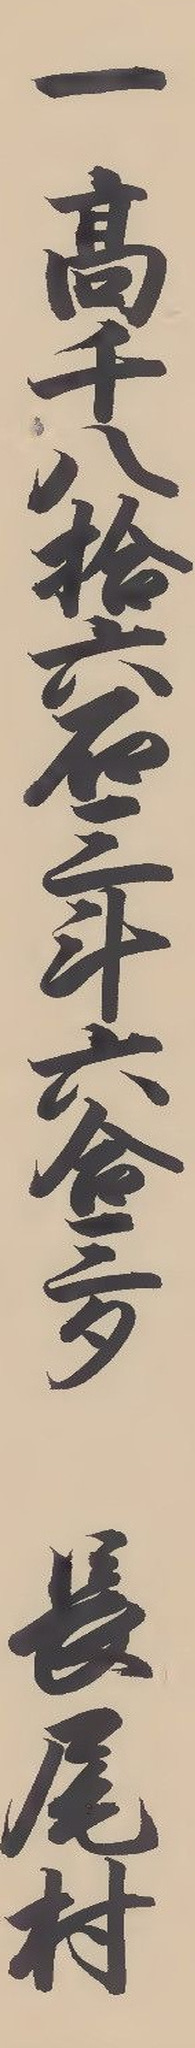一高千八拾六石三斗六合三勺長尾村
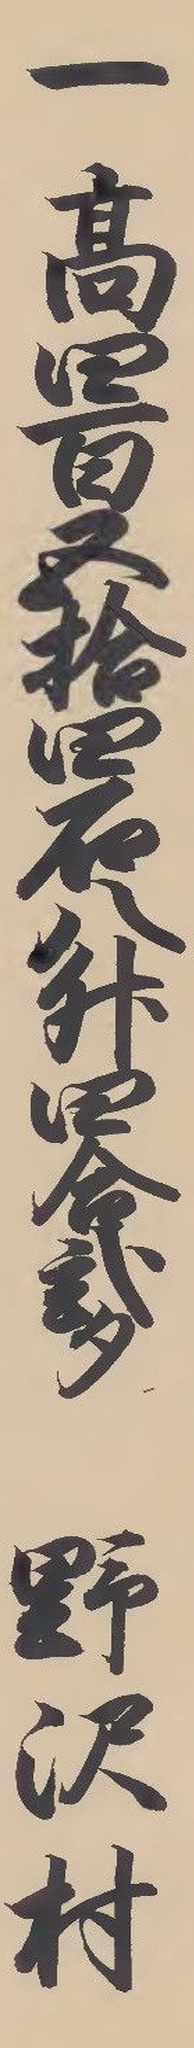一高四百五拾四石八升四合弐勺野沢村
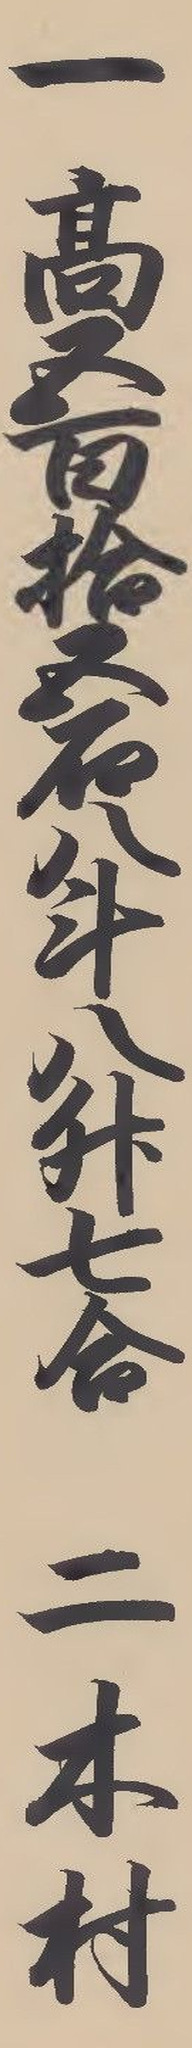一高五百拾五石八斗八升七合二木村
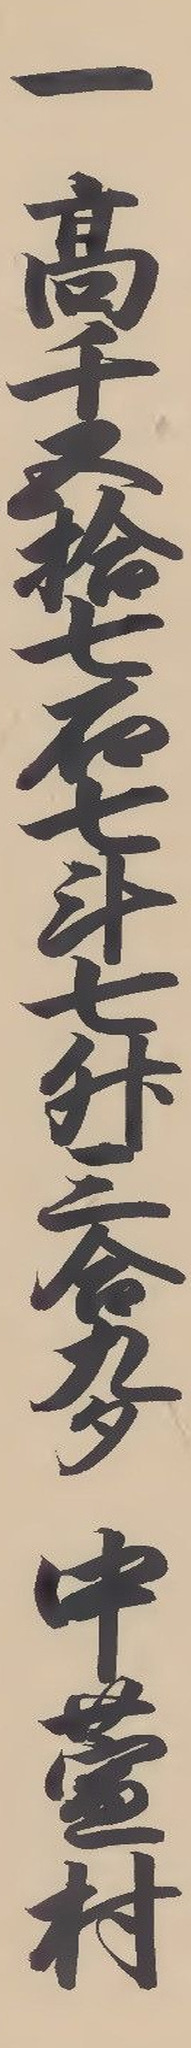一高千五拾七石七斗七升三合九勺中萱村
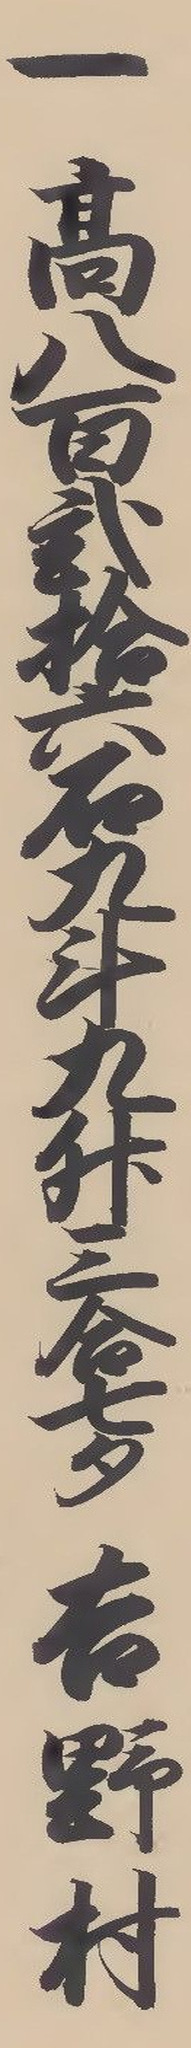一高八百弐拾六石九斗九升三合七勺吉野村
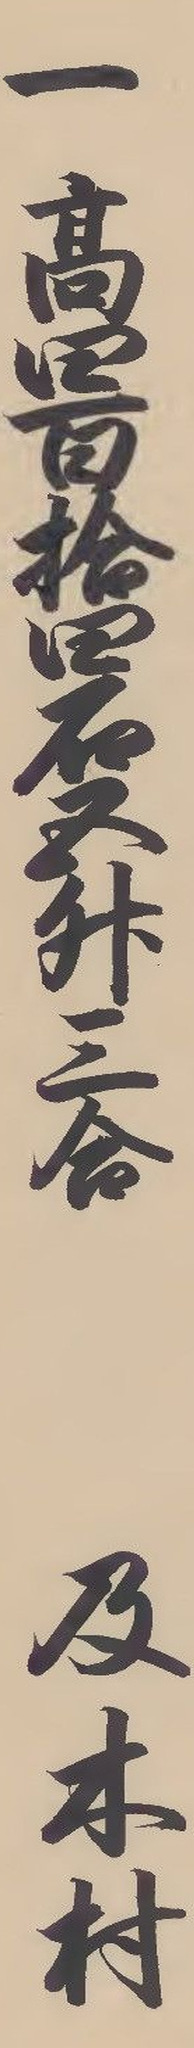一高四百拾四石五升三合及木村

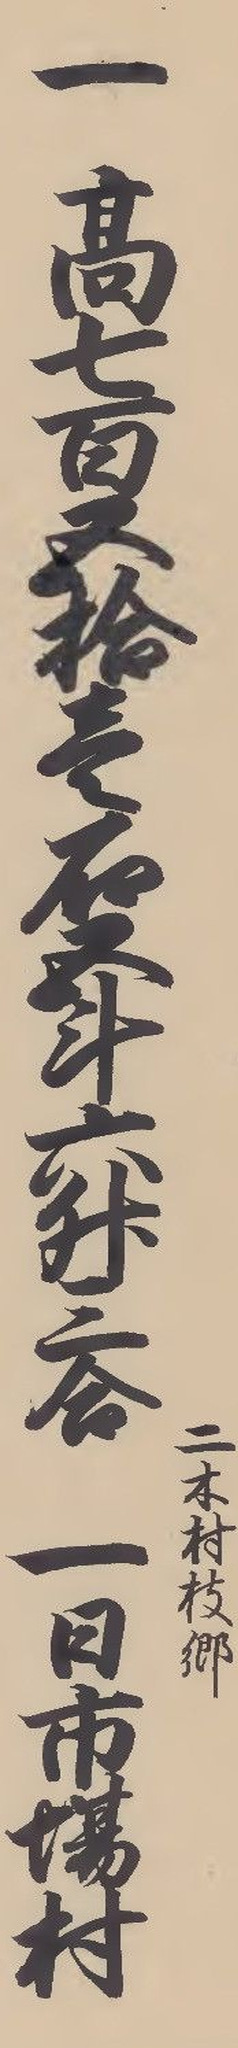一高七百五拾壱石五斗六升三合一日市場村
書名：信濃国郷帳
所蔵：国立公文書館 National Archives of Japan
